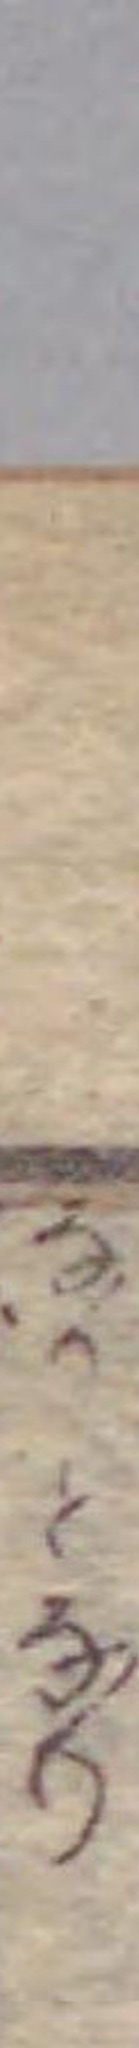なりとなり
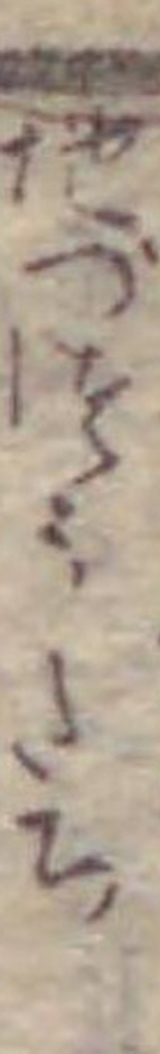地づつうたち
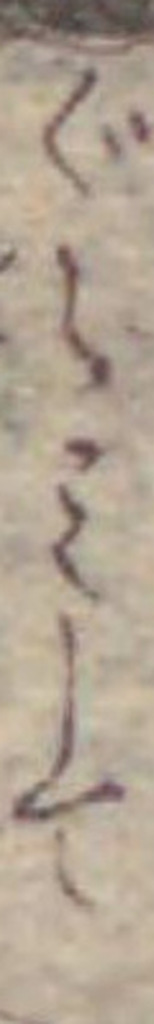ぐらみして
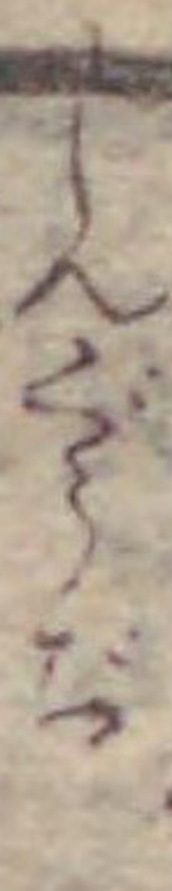しんだうぢ
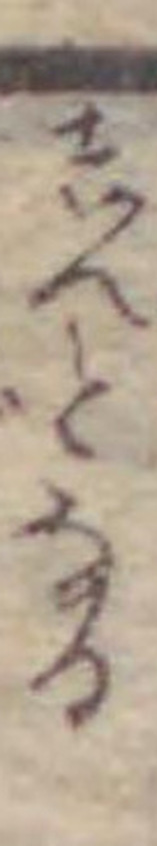しんとなる
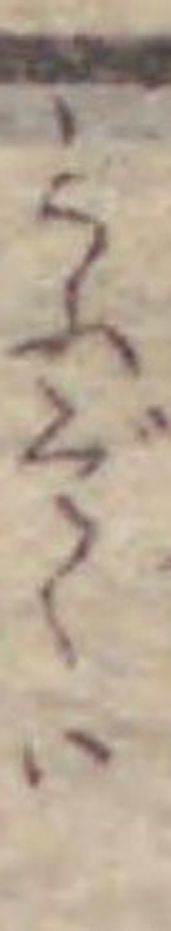とふぞくは
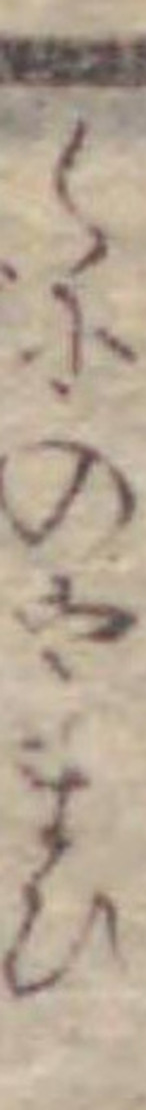くにのやまひ
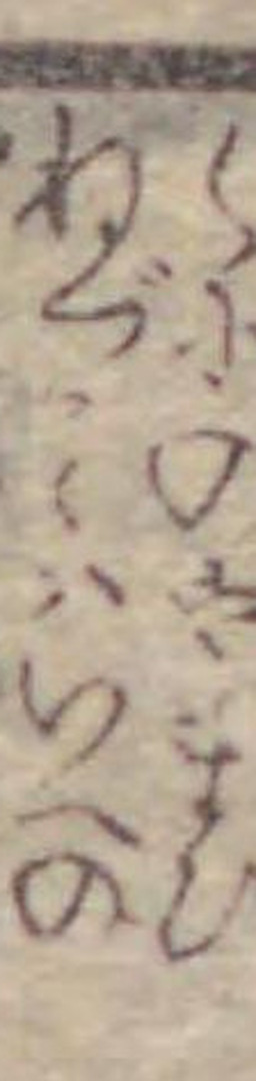ねづみはいへの
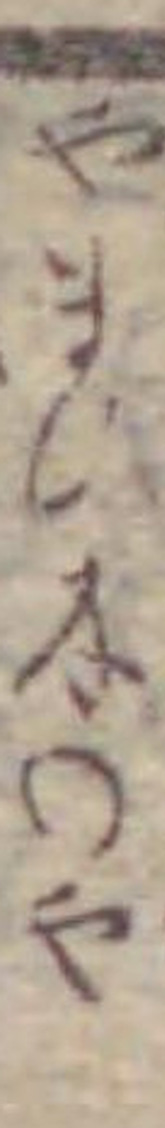やまひ木のや
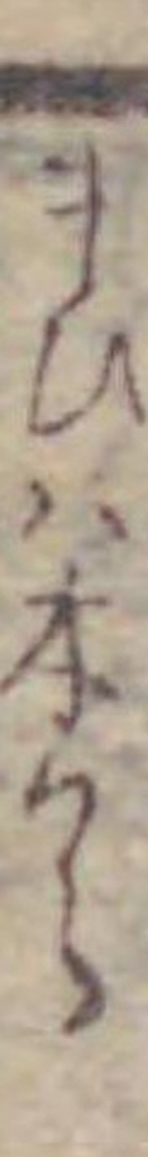まひは木から
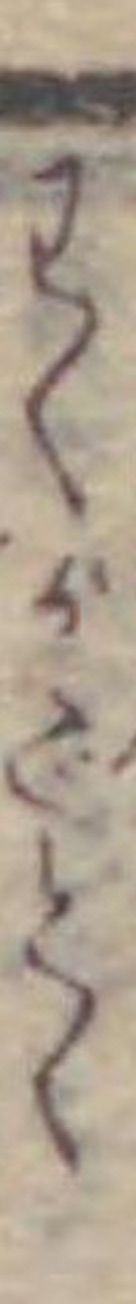わくがごとく
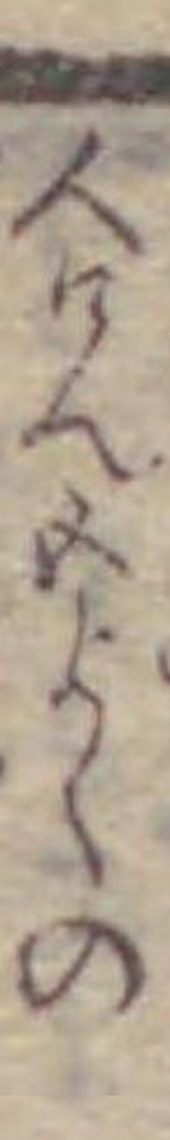人けん五よくの
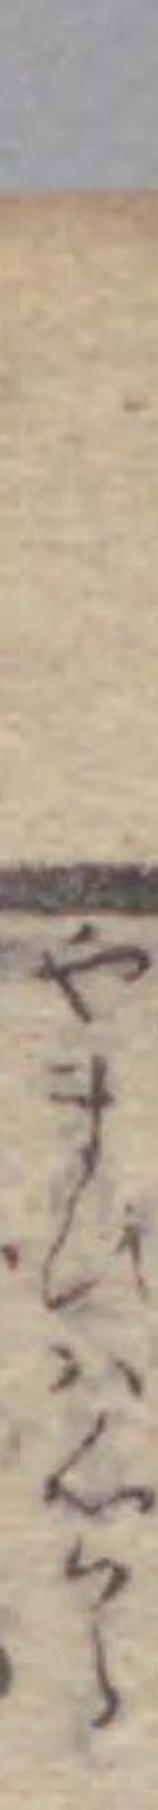やまひは心から
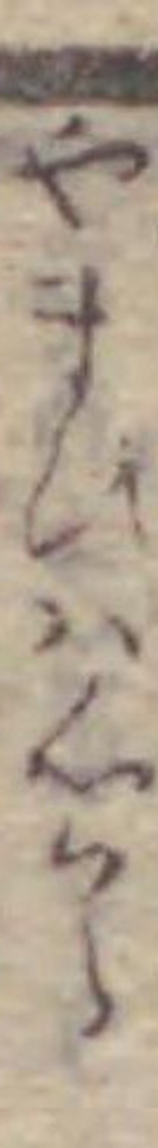やまひは心から
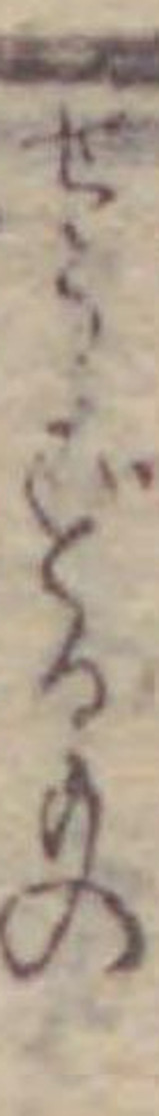せうずるもの
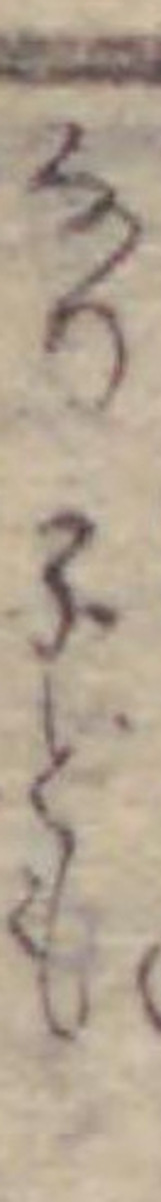なり子ども
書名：鼻下長生薬 : 3巻
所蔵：国立国会図書館 National Diet Library, JAPAN
